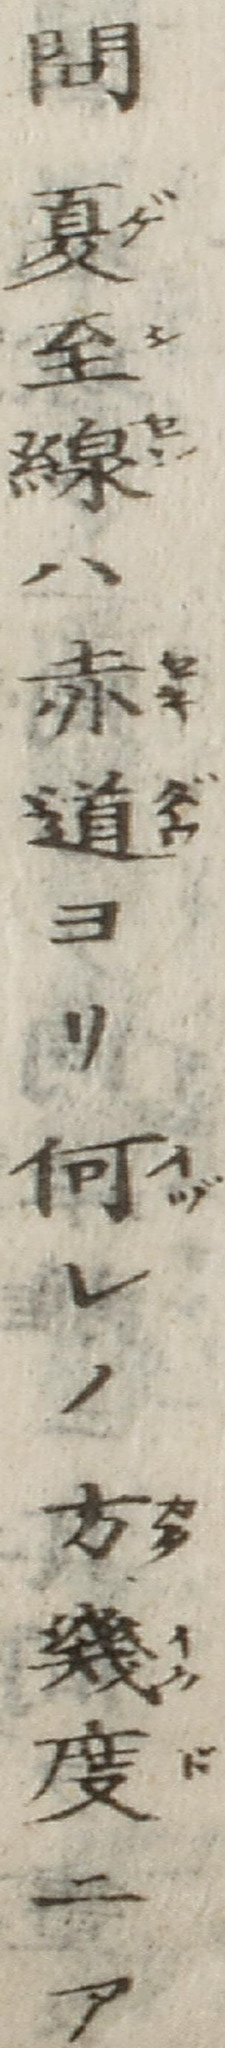問夏至線ハ赤道ヨリ何レノ方幾度ニア
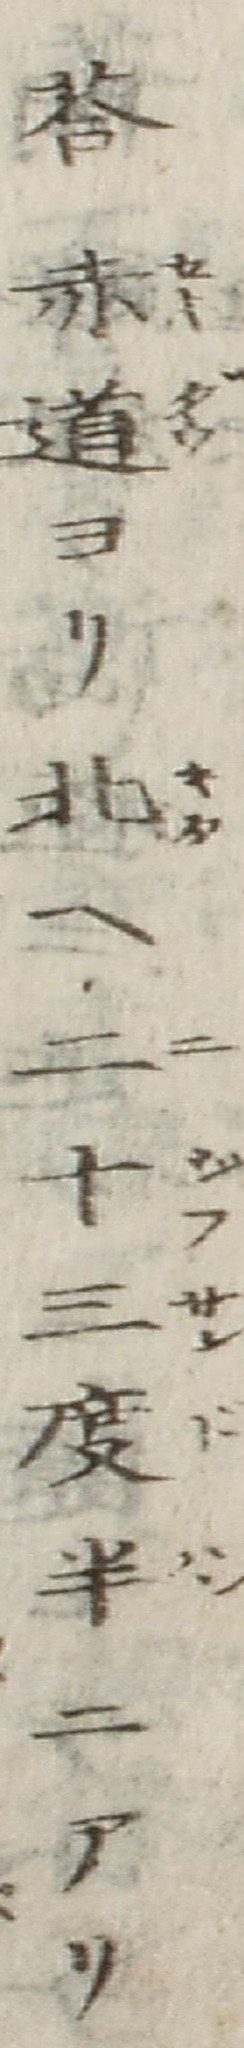答赤道ヨリ北へ二十三度半ニアリ
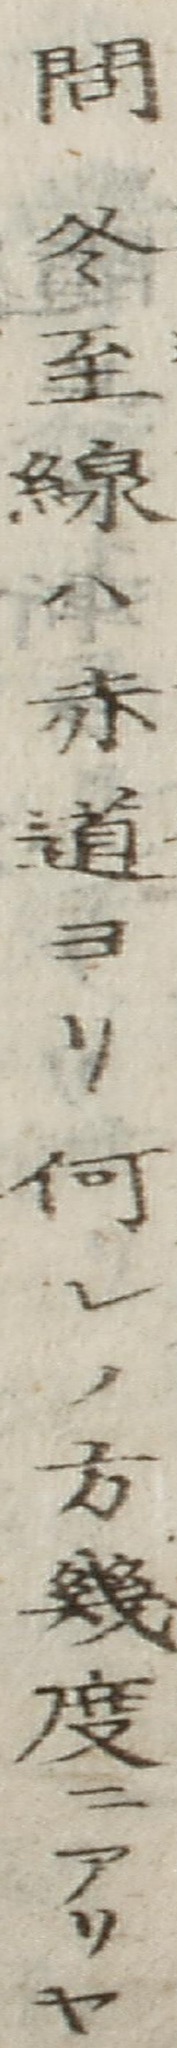問冬至線ハ赤道ヨリ何レノ方幾度ニアリヤ
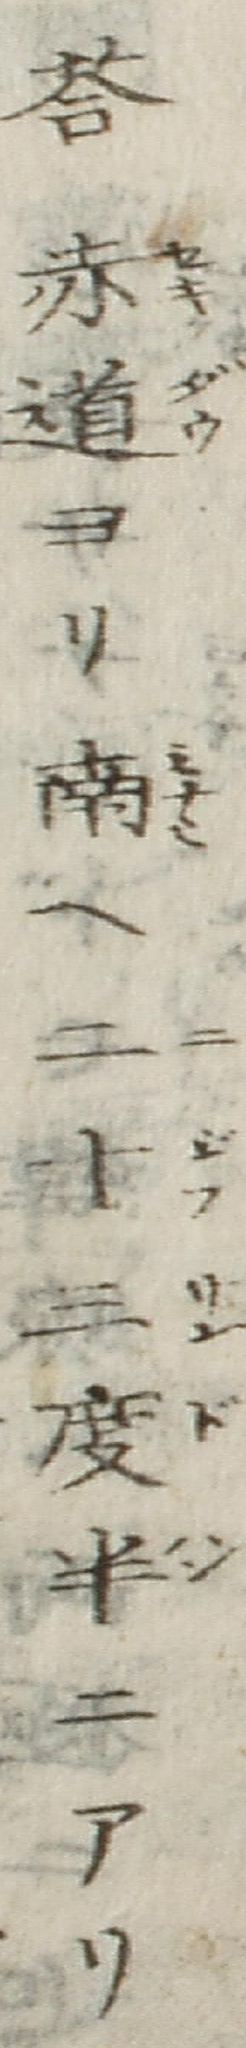答赤道ヨリ南へ二十三度半ニアリ
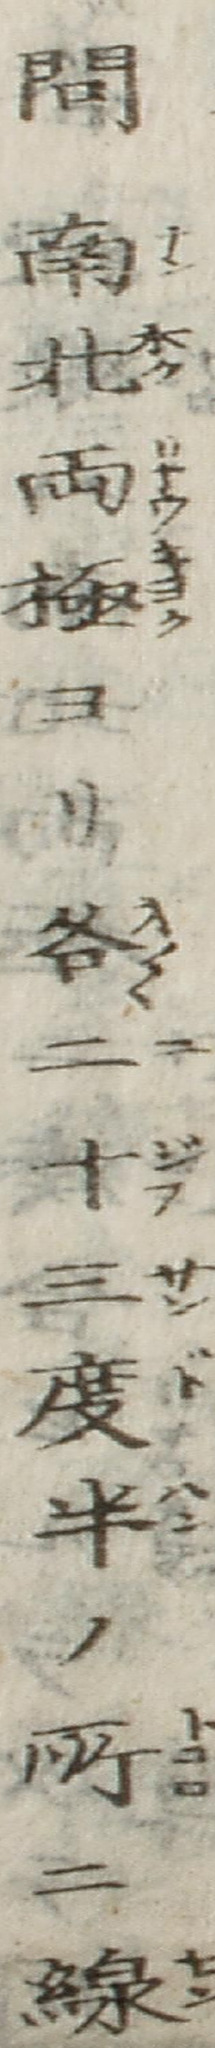問南北両極ヨリ各二十三度半ノ所ニ線
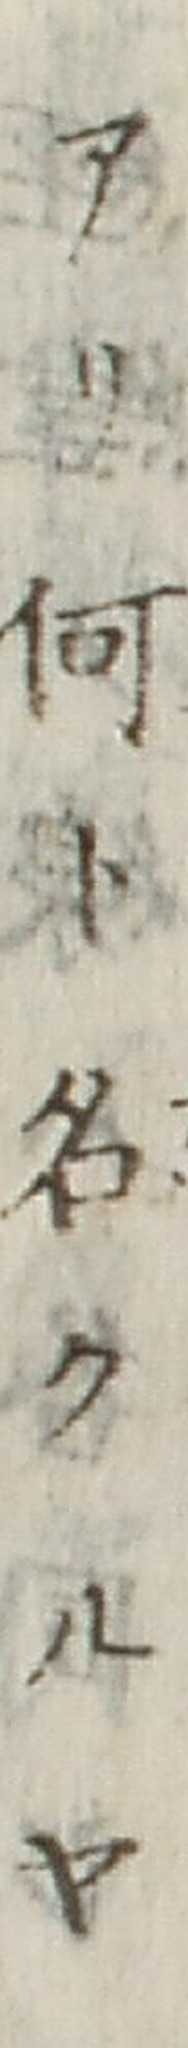アリ何ト名クルヤ
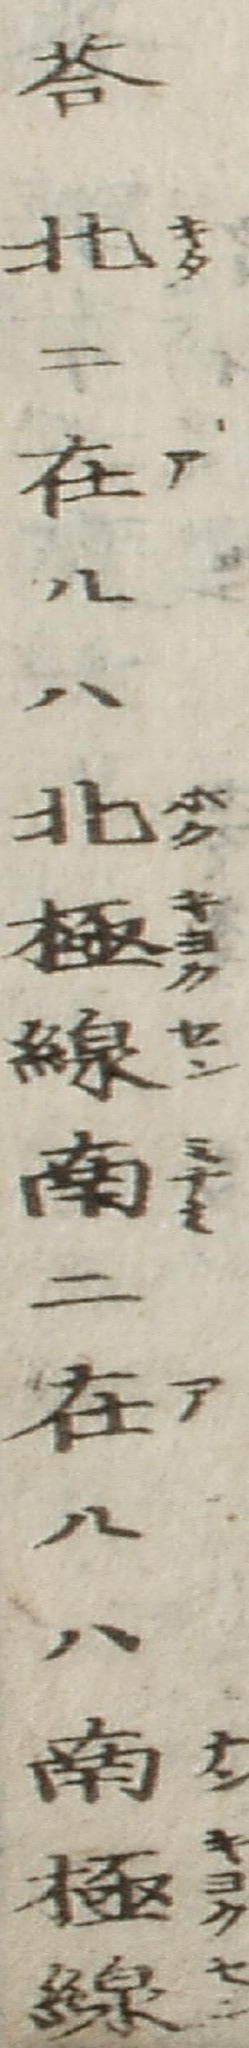答北ニ在ルハ北極線南ニ在ルハ南極線

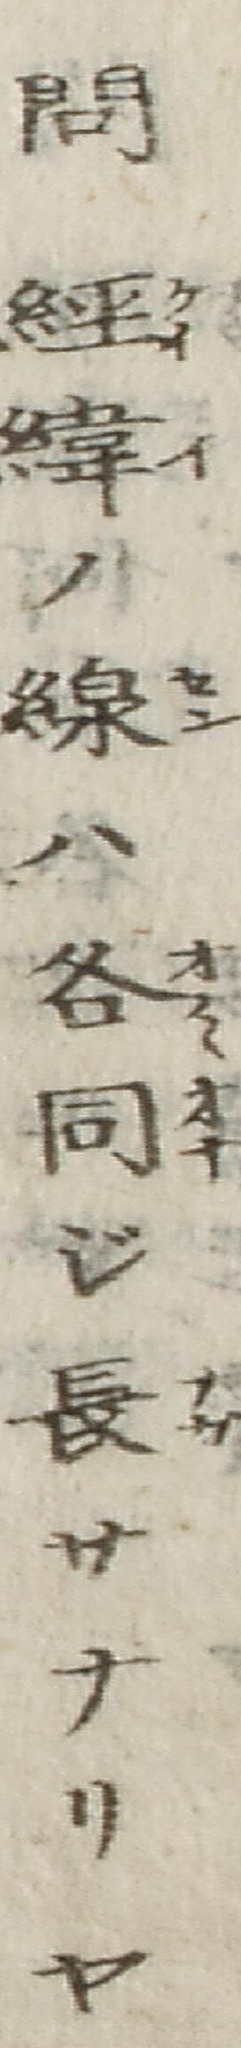問経緯ノ線ハ各同ジ長サナリヤ
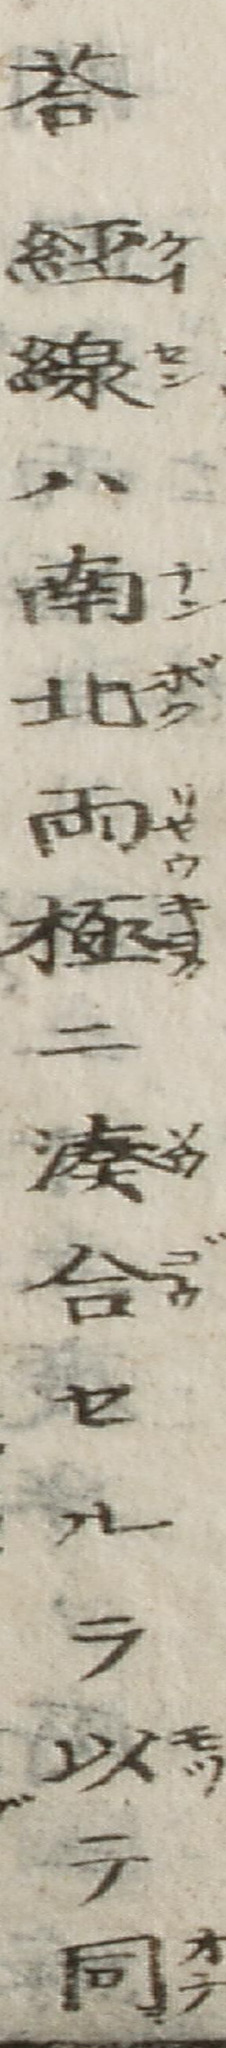答経線ハ南北両極ニ湊合セルヲ以テ同
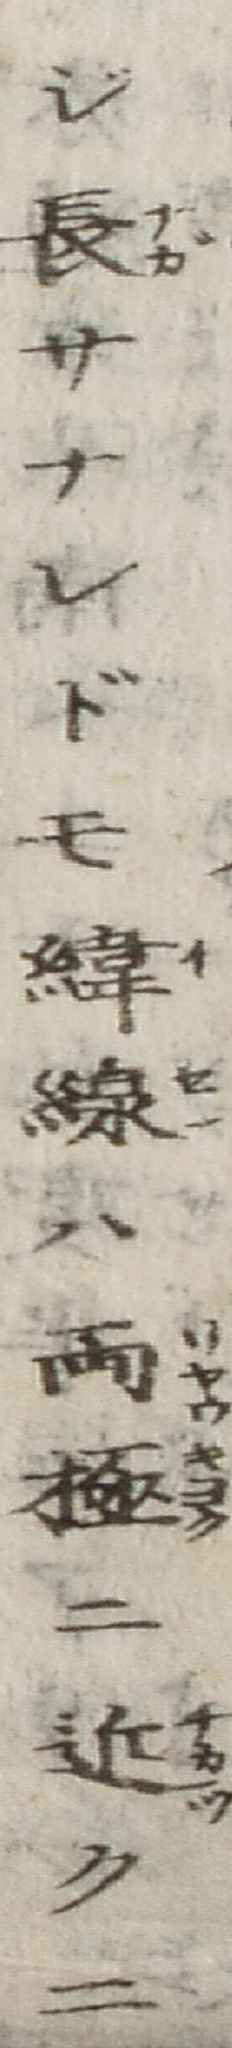ジ長サナレドモ緯線ハ両極ニ近クニ
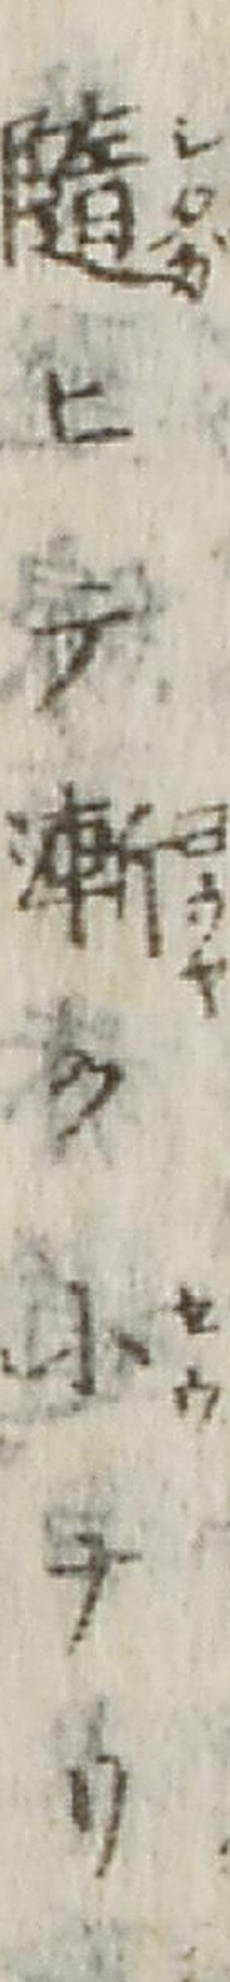随ヒテ漸ク小ナリ
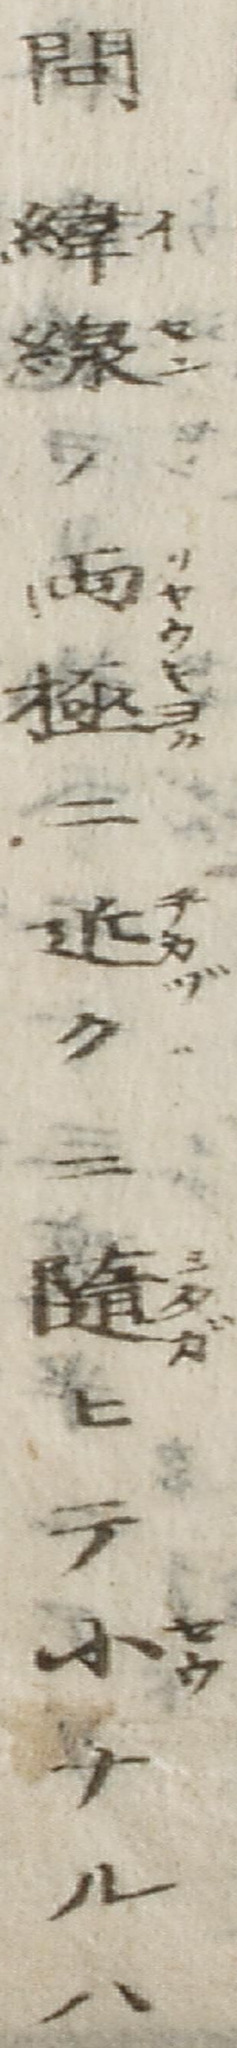問緯線ノ両極ニ近クニ随ヒテ小ナルハ
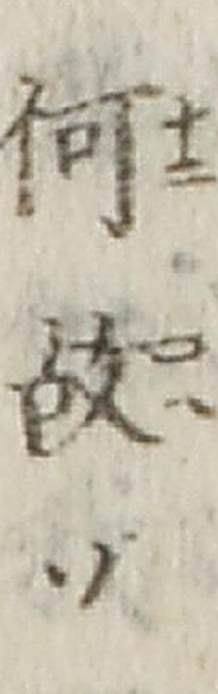何故ソ
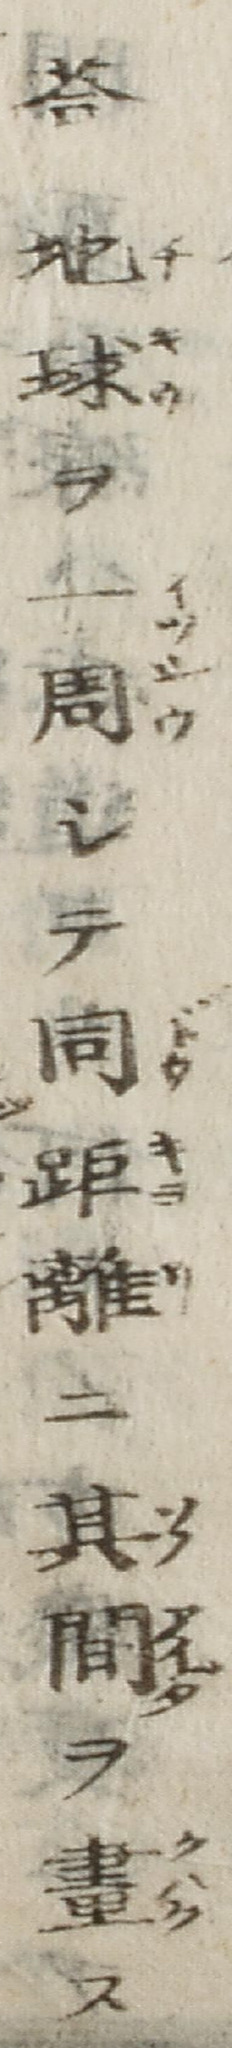答地球ヲ一周シテ同距離ニ其間ヲ画ス
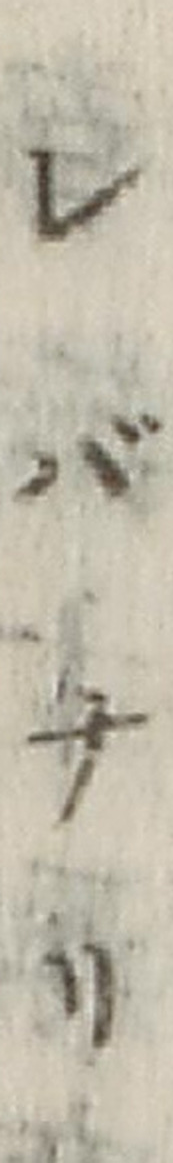レバナリ
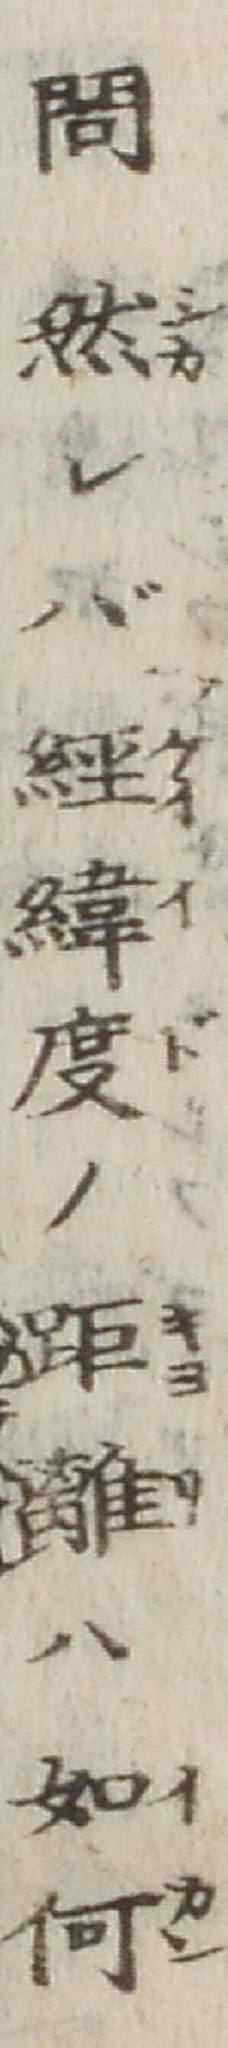問然レバ経緯度ノ距離ハ如何
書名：地球儀問答　全
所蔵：東京大学地震研究所図書室 Earthquake Research Institute Library, The University of Tokyo, JAPAN
